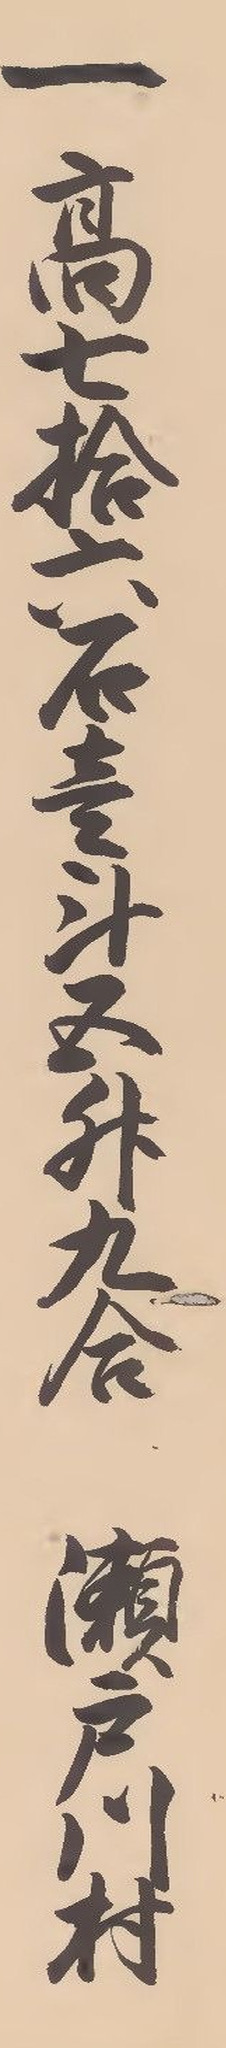一高七拾六石壱斗五升九合瀬戸川村
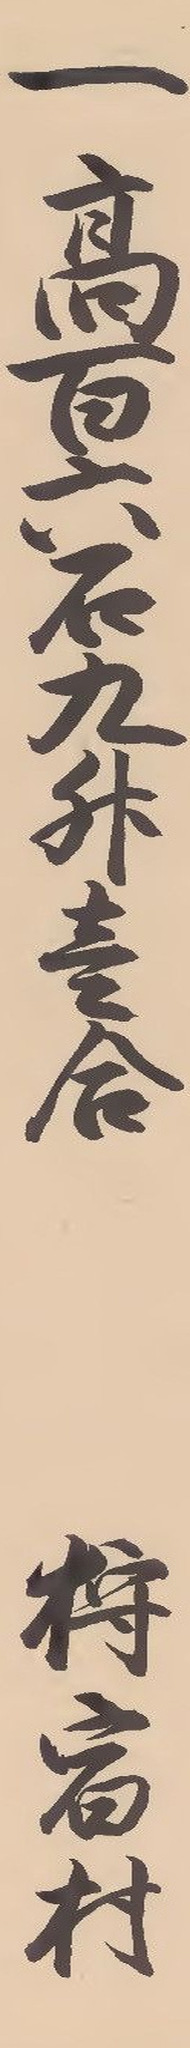一高百六石九升壱合狩宿村
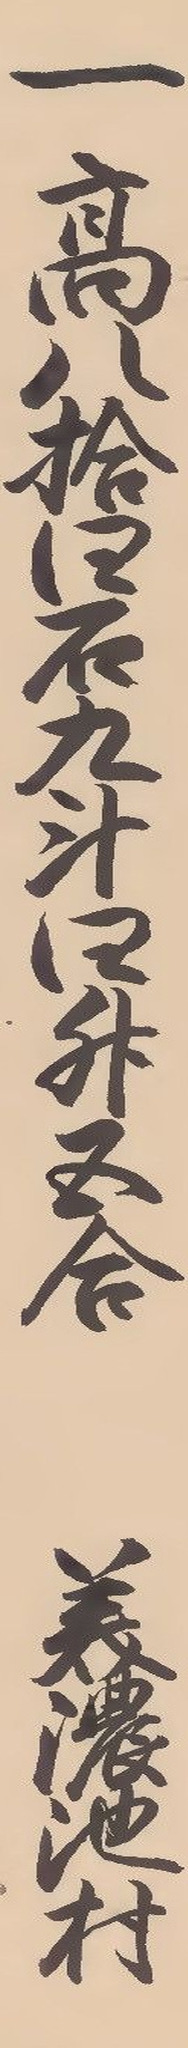一高八拾四石九斗四升五合美濃池村
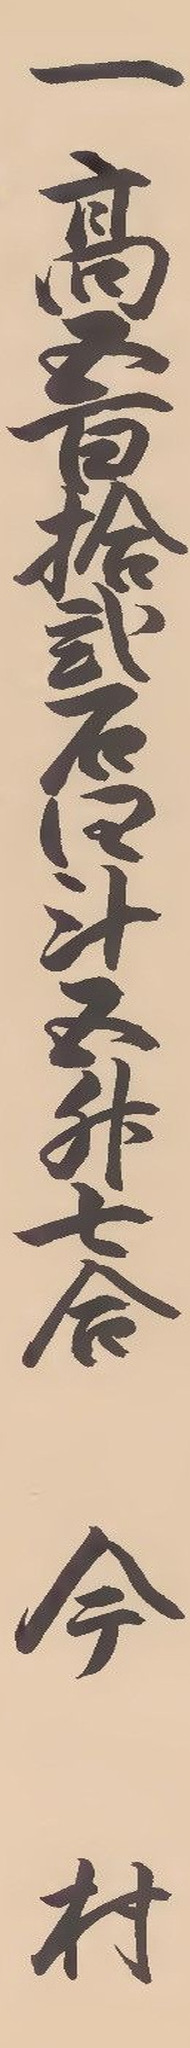一高五百拾弐石四斗五升七合今村
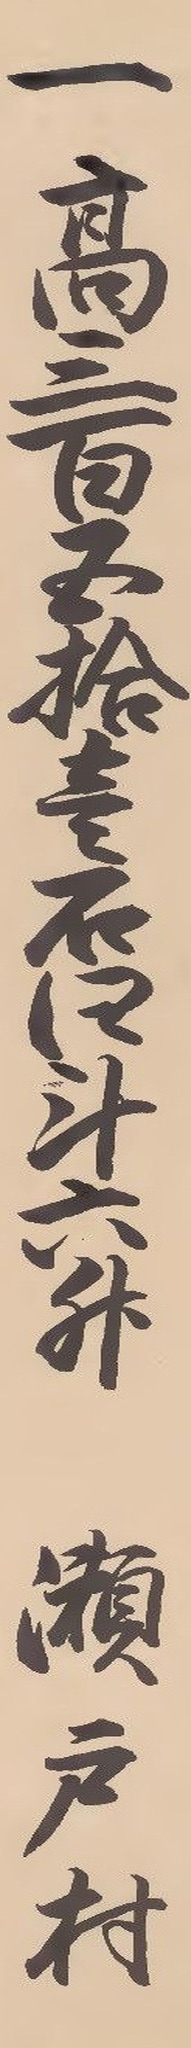一高三百五拾壱石四斗六升瀬戸村
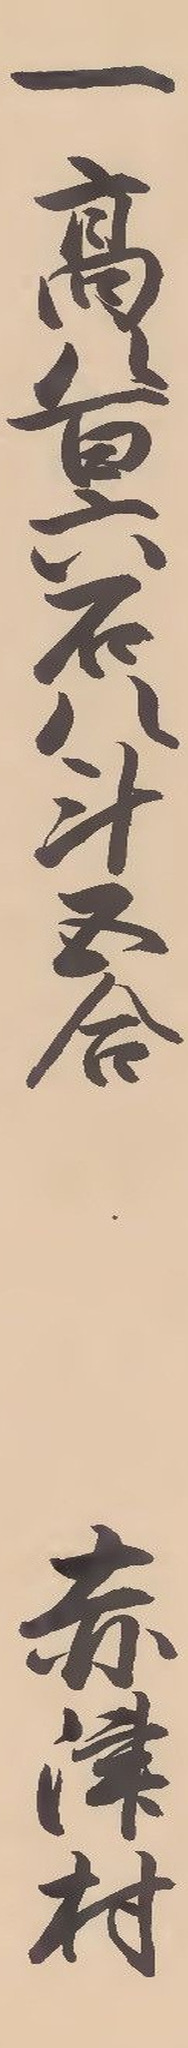一高八百六石八斗五合赤津村
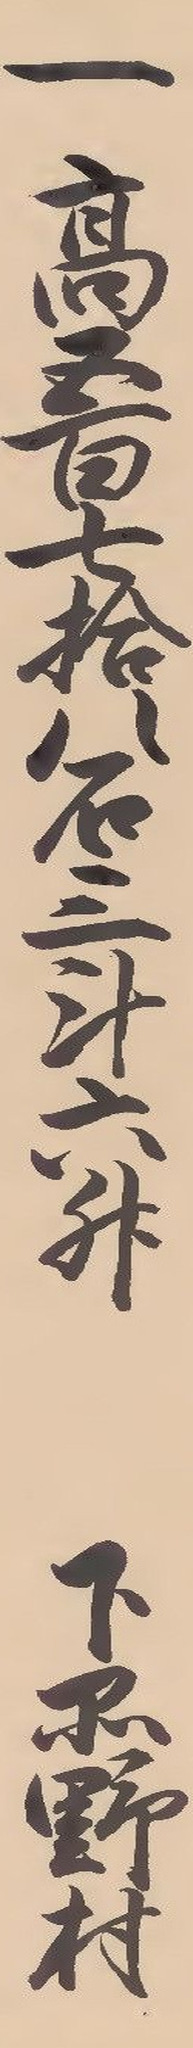一高五百七拾八石三斗六升下品野村
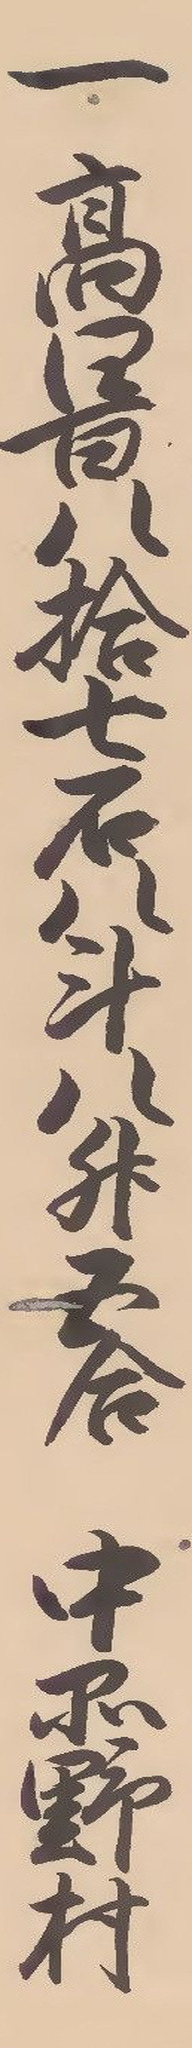一高四百八拾七石八斗八升五合中品野村

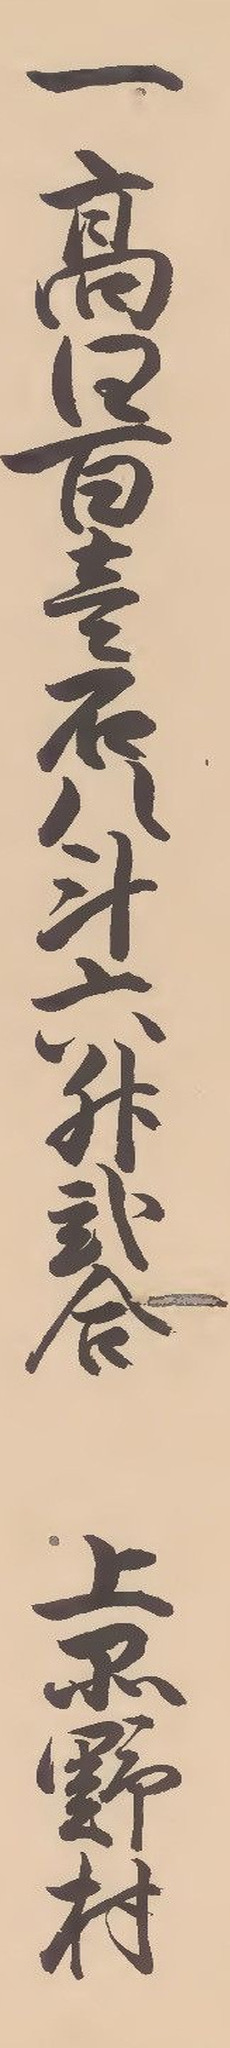一高四百壱石八斗六升弐合上品野村
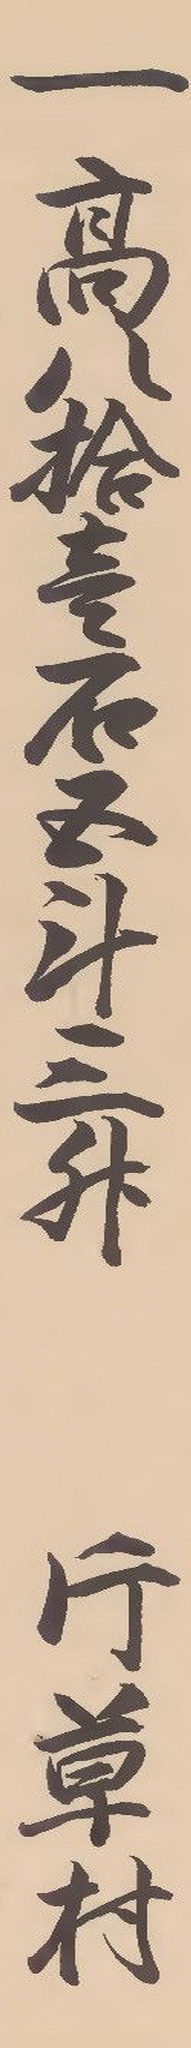一高八拾壱石五斗三升片草村
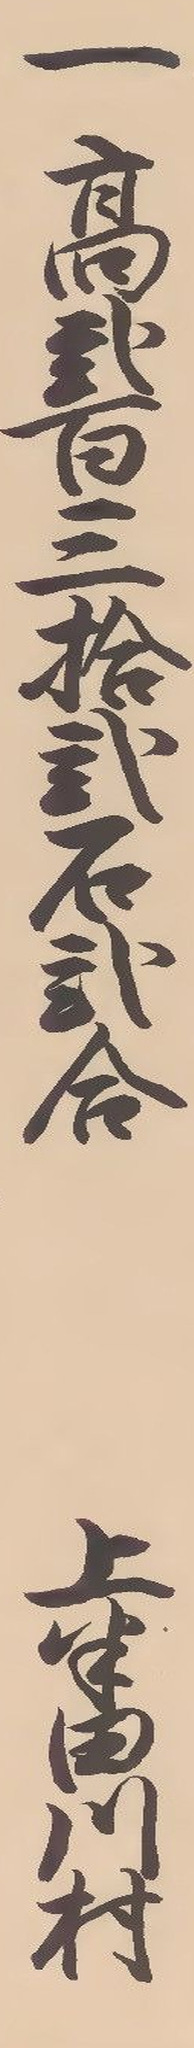一高弐百三拾弐石弐合上半田川村
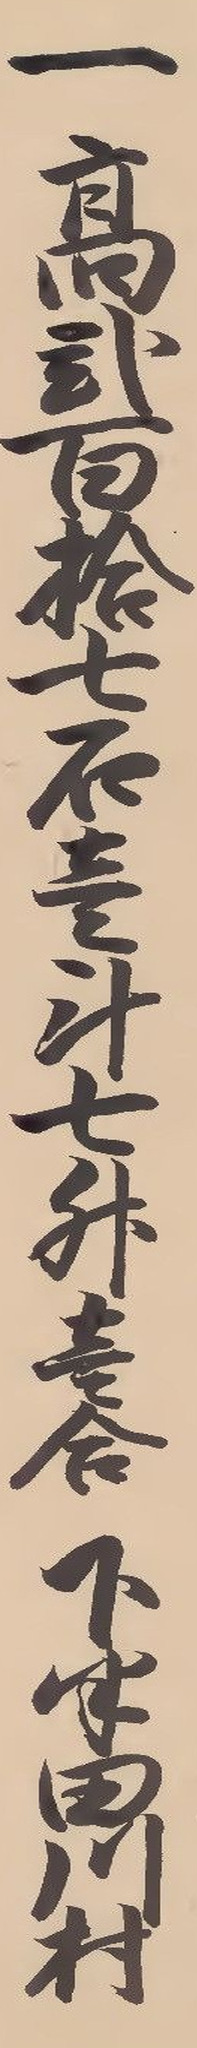一高弐百拾七石壱斗七升壱合下半田川村
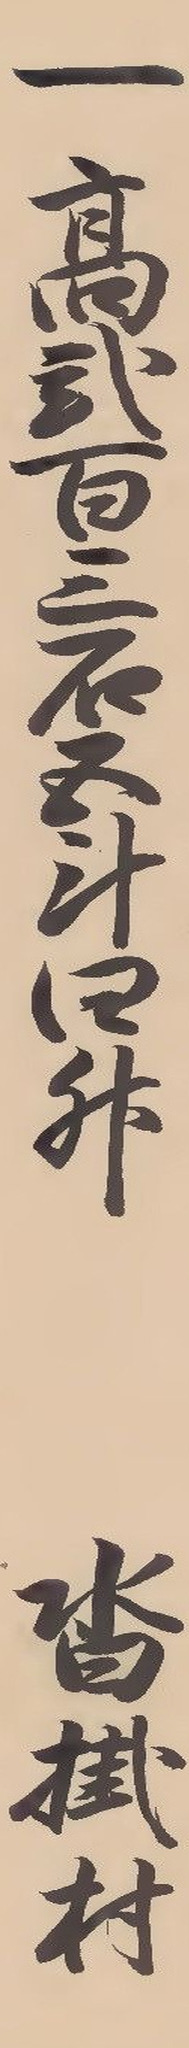一高弐百三石五斗四升沓掛村
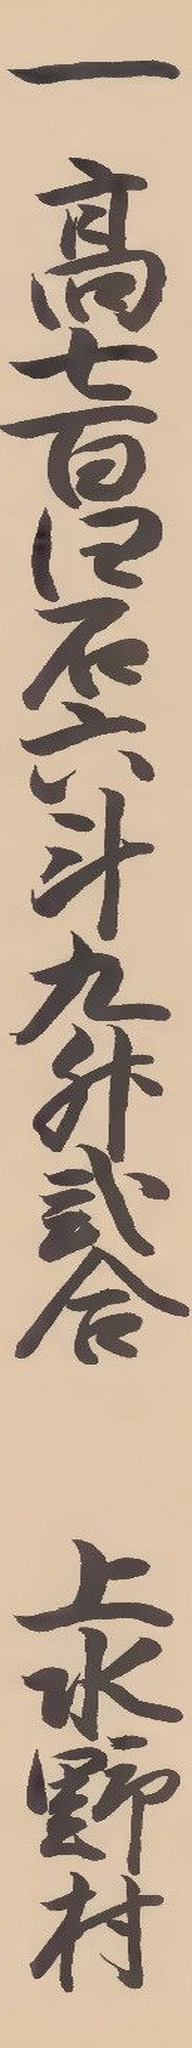一高七百四石六斗九升弐合上水野村
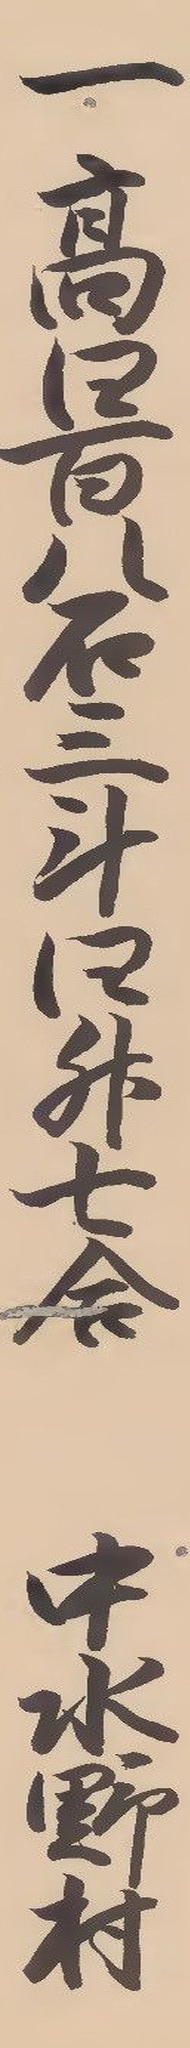一高四百八石三斗四升七合中水野村

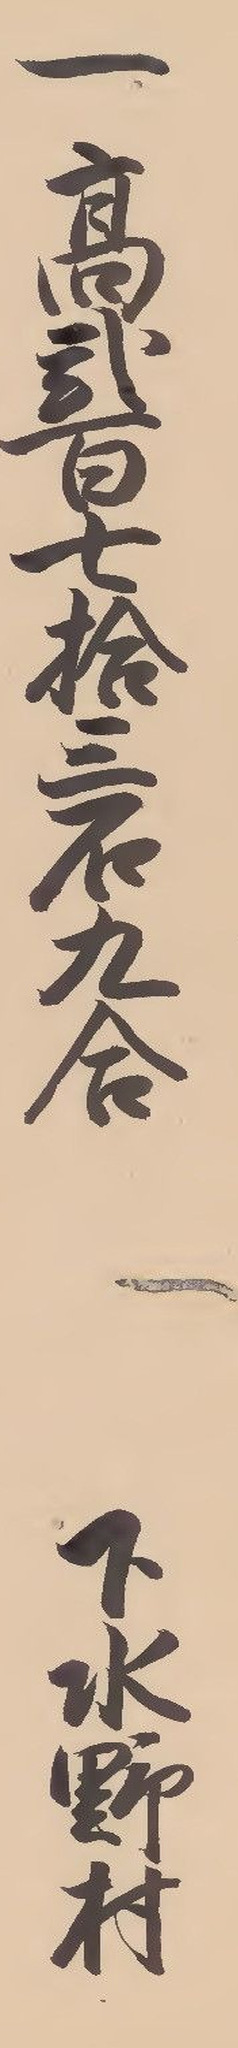一高弐百七拾三石九合下水野村
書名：尾張国郷帳
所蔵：国立公文書館 National Archives of Japan
